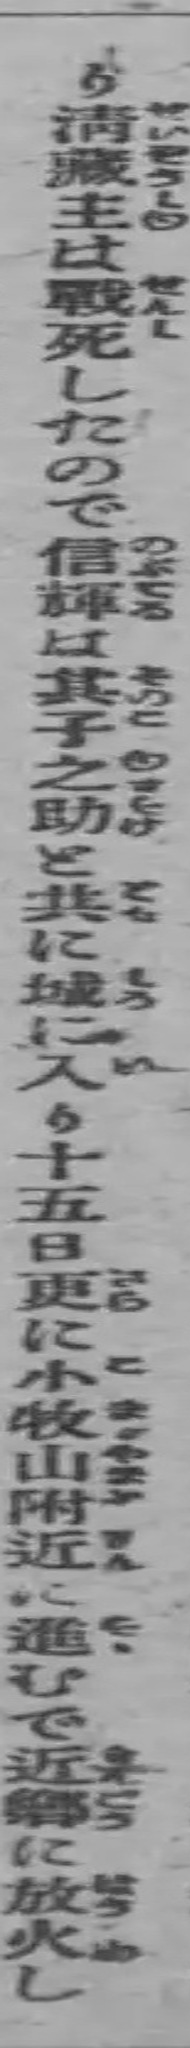り清蔵主は戦死したので信輝は其子之助と共に城に入り十五日更に小牧山附近に進むで近郷に放火し
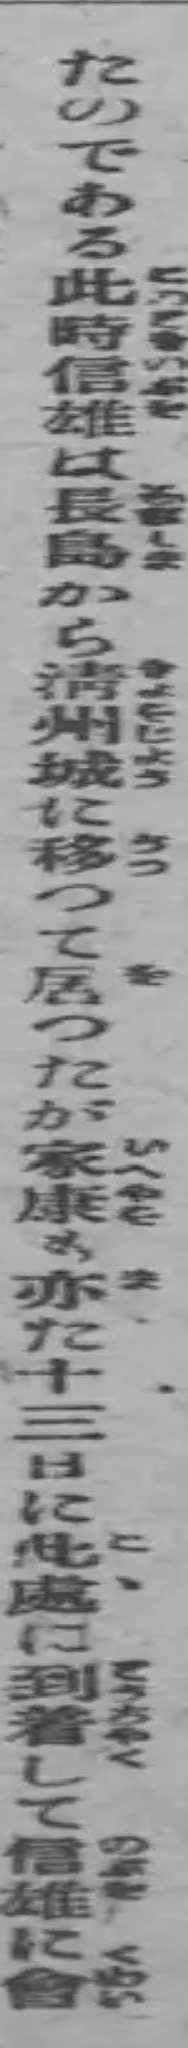たのである此時信雄は長島から清洲城に移つて居つたが家康も亦た十三日に此処に到着して信雄に会
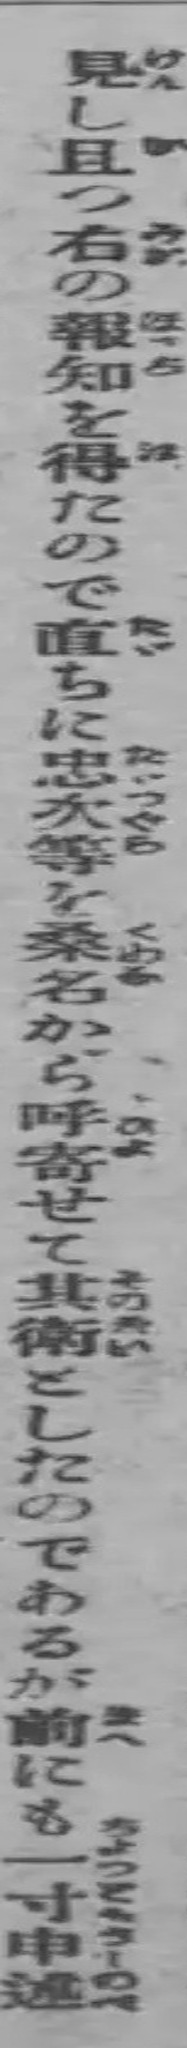見し且つ右の報知を得たので直ちに忠次等を桑名から呼寄せて其衛としたのであるが前にも一寸申述
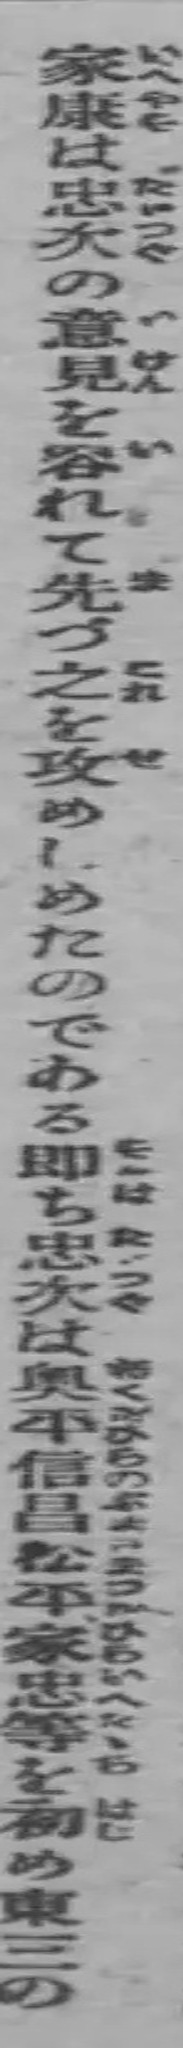家康は忠次の意見を容れて先づ之を攻めしめたのである即ち忠次は奥平信昌松平家忠等を初め東三の
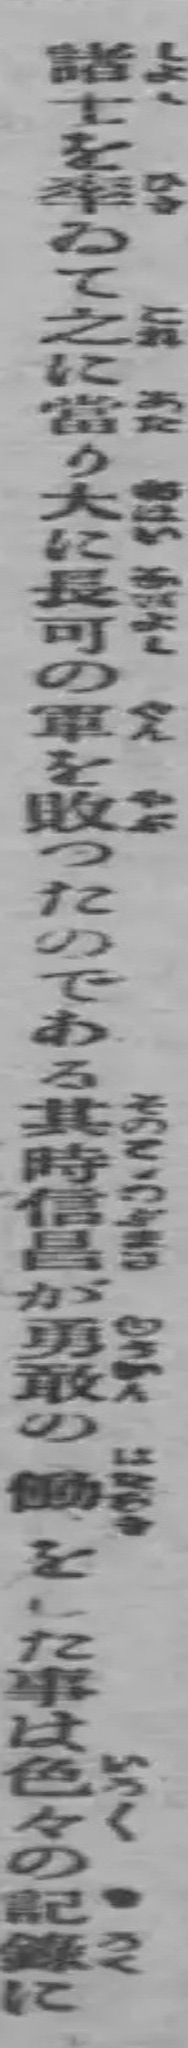諸士を率ゐて之に当り大に長可の軍を敗つたのである其時信昌が勇敢の働をした事は色々の記録に
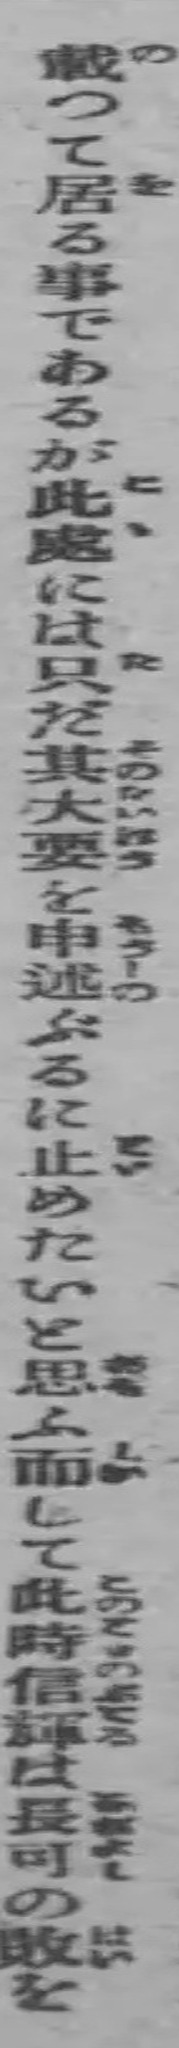載つて居る事であるが此処には只だ其大要を申述ぶるに止めたいと思ふ而して此時信輝は長可の敗を
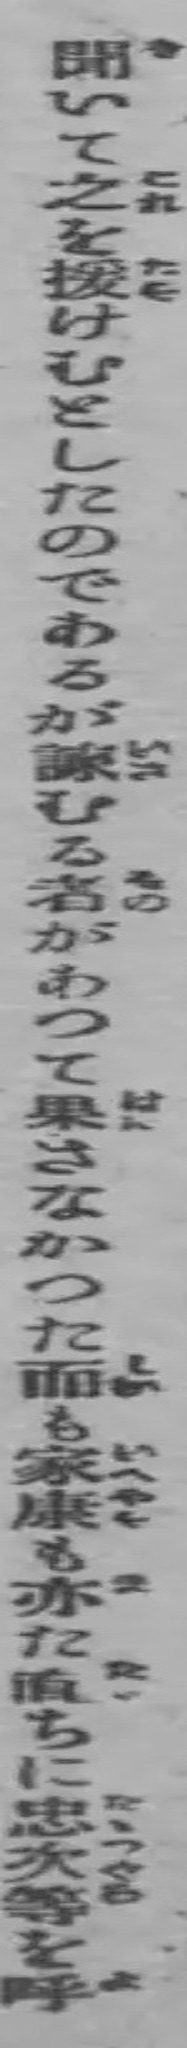聞いて之を援けむとしたのであるが諌むる者があつて果さなかつた而も家康も亦た直ちに忠次等を呼
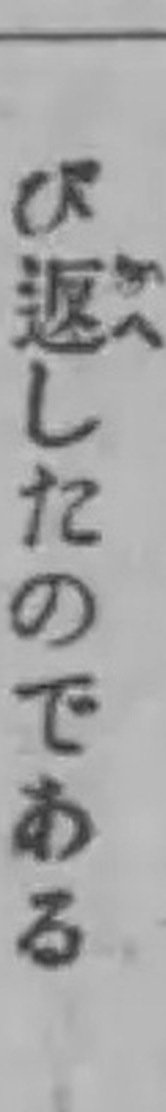び返したのである
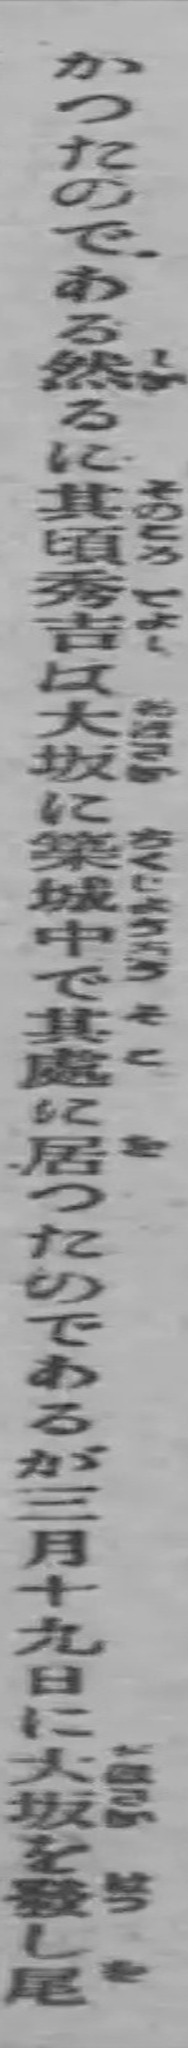かつたのである然るに其頃秀吉は大坂に築城中で其処に居つたのであるが三月十九日に大坂を発し尾
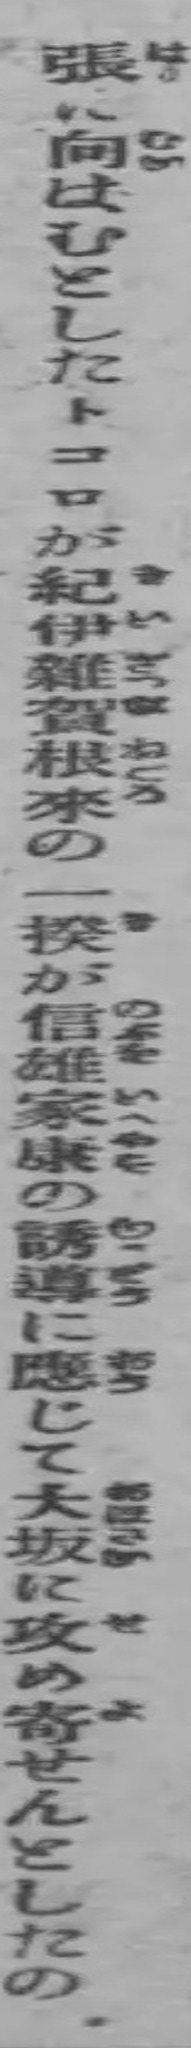張に向はむとしたトコロが紀伊雑賀根来の一揆が信雄家康の誘導に応じて大坂に攻め寄せんとしたの
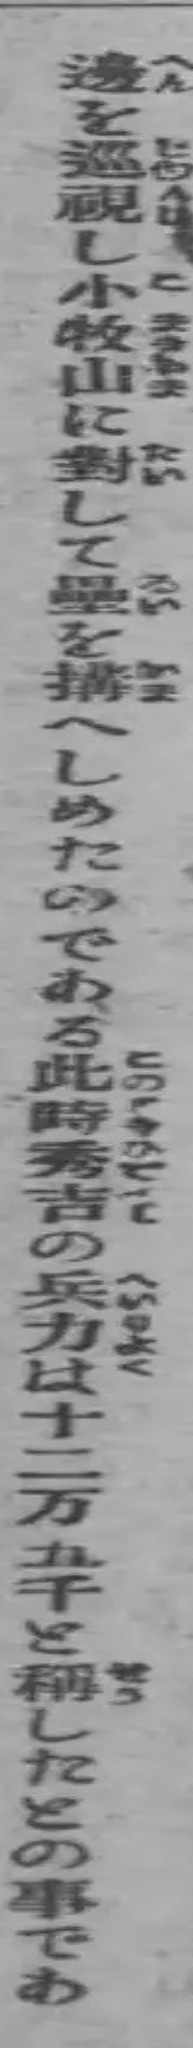返を巡視し小牧山に対して塁を搆へしめたのである此時秀吉の兵力は十二万五千と称したとの事であ

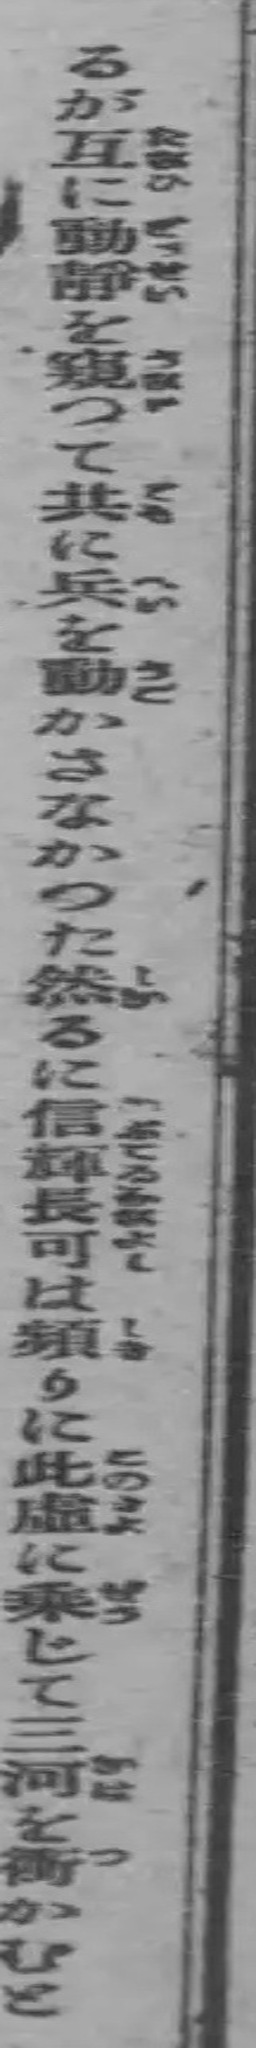るが互に動静を窺つて共に兵を動かさなかつた然るに信輝長可は頻りに此虚に乗じて三河を衝かむと
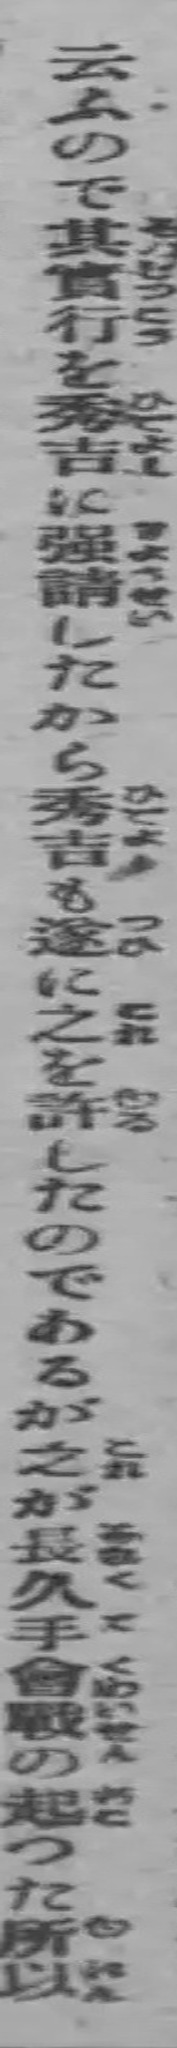長久手会戦云ふので其実行を秀吉に強請したから秀吉も遂に之を許したのであるが之が長久手会戦の起つた所以
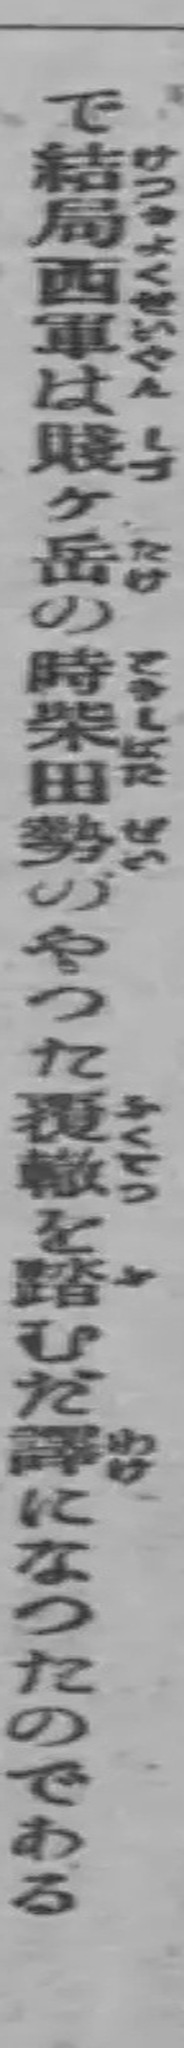で結局西軍は賤ケ岳の時柴田勢のやつた覆轍を踏むだ訳になつたのである
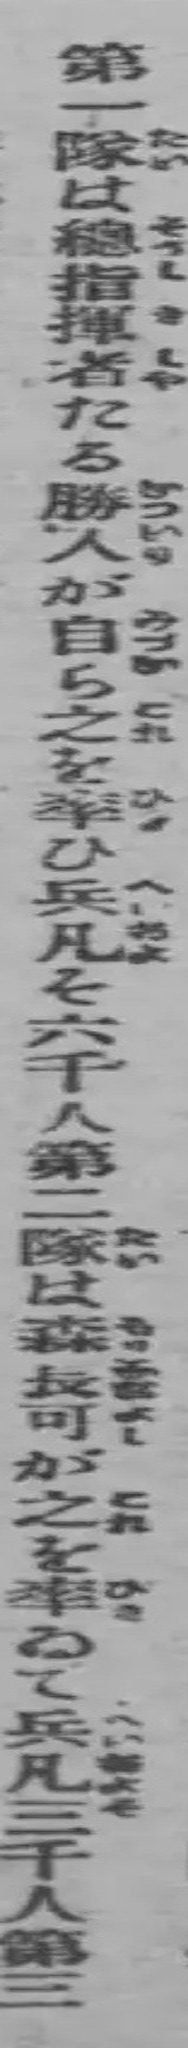第一隊は総指揮者たる勝入が自ら之を率ひ兵凡六千人第二隊は森長可が之を率ゐて兵凡三千人第三
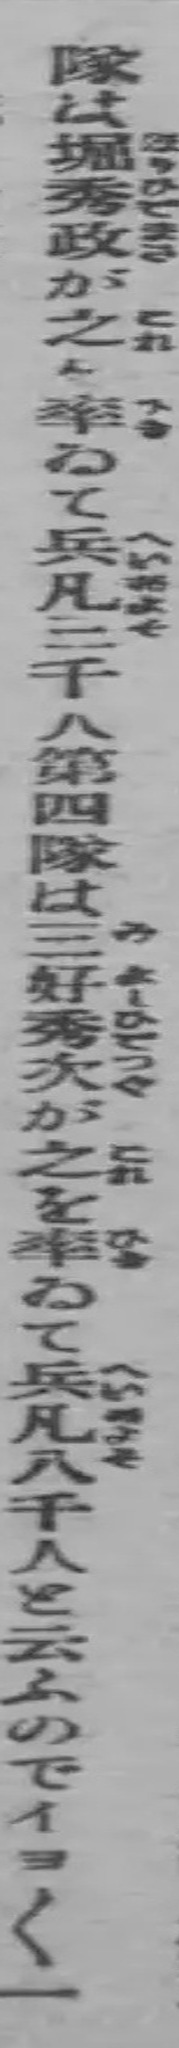隊は堀秀政が之を率ゐて兵凡三千人第四隊は三好秀次が之を率ゐて兵凡八千人と云ふのでイヨ〳〵一
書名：豊橋市史談
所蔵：国立国会図書館 National Diet Library, JAPAN
